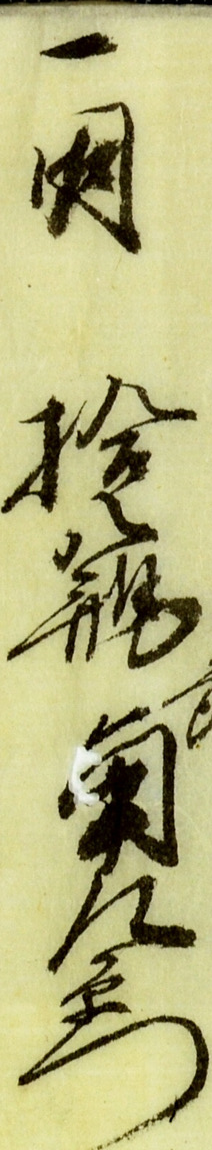一同拾八瓶角左衛門
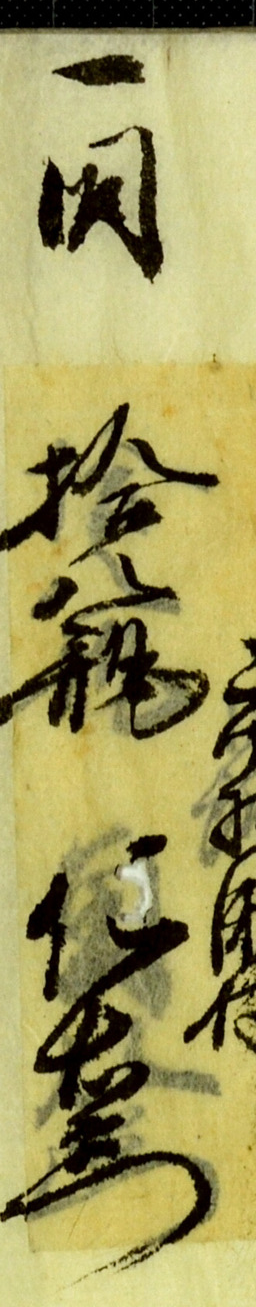一同拾五瓶与右衛門

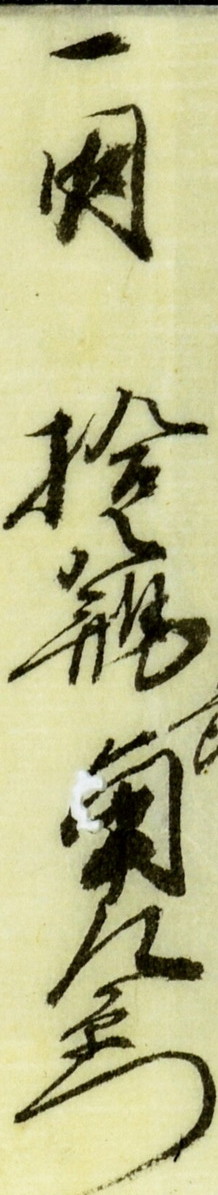一同拾八瓶仁右衛門
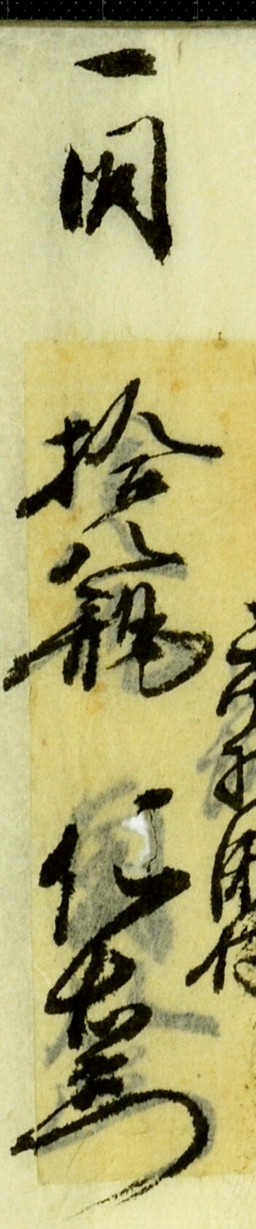一同拾八瓶仁右衛門
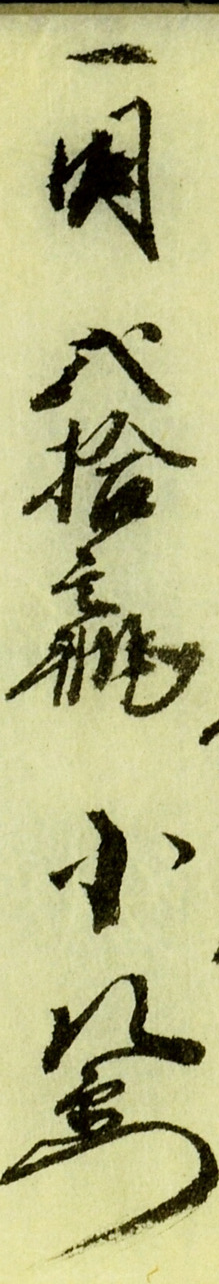一同弐拾壱瓶小左衛門
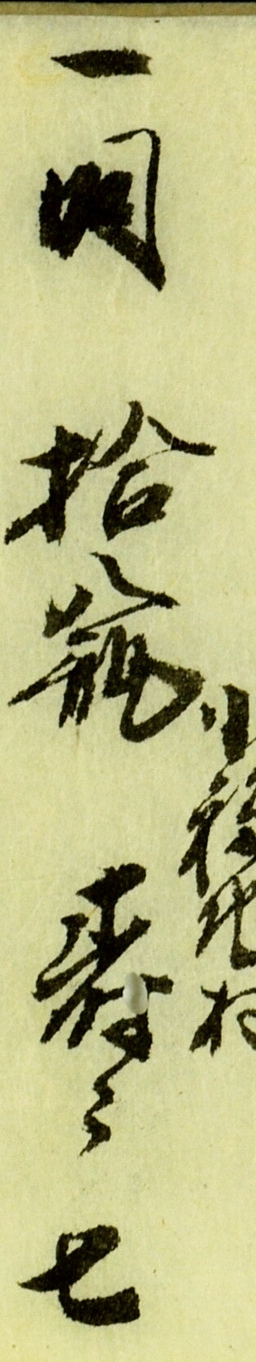一同拾八瓶寿々七
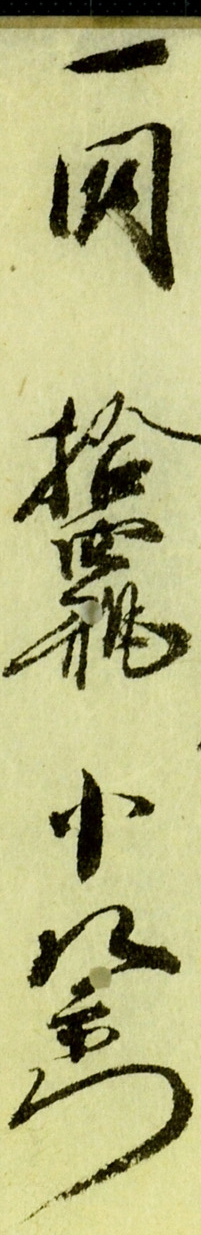一同拾八瓶仁右衛門
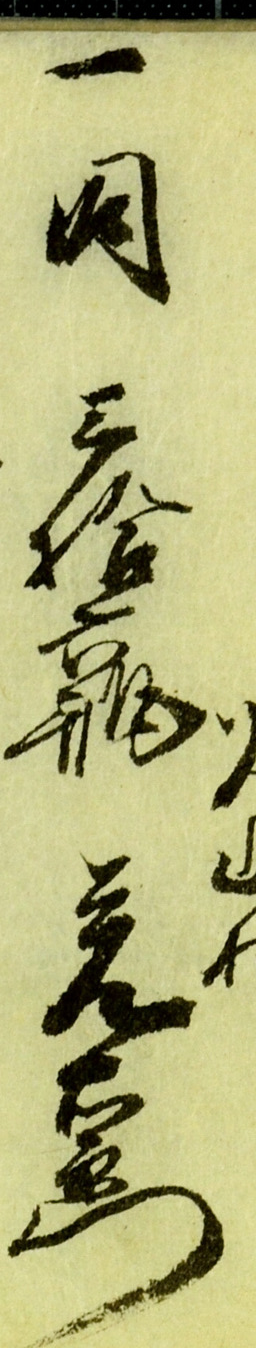一同三拾六瓶覚右衛門

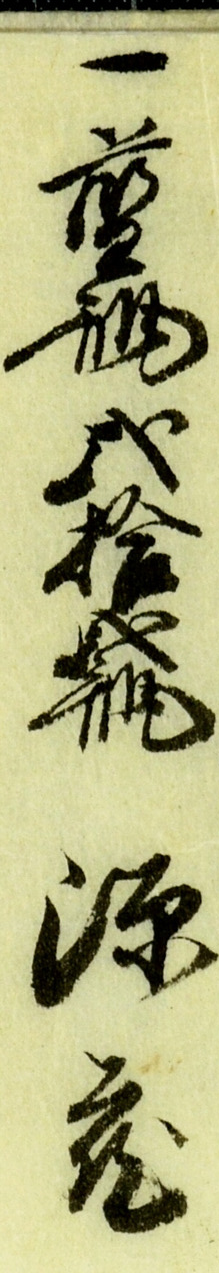一藍瓶弐拾弐瓶源蔵
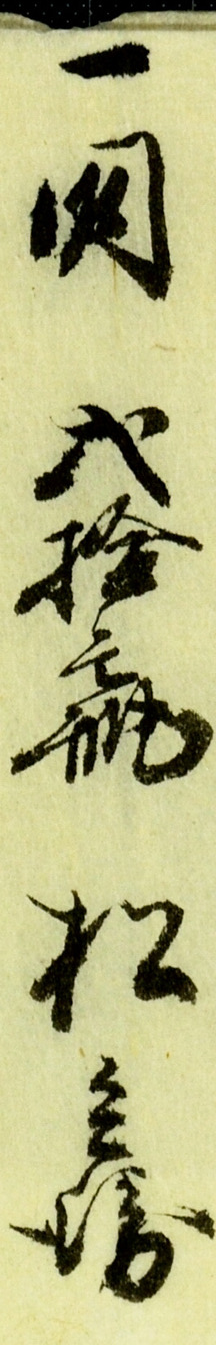一同弐拾壱瓶松兵衛
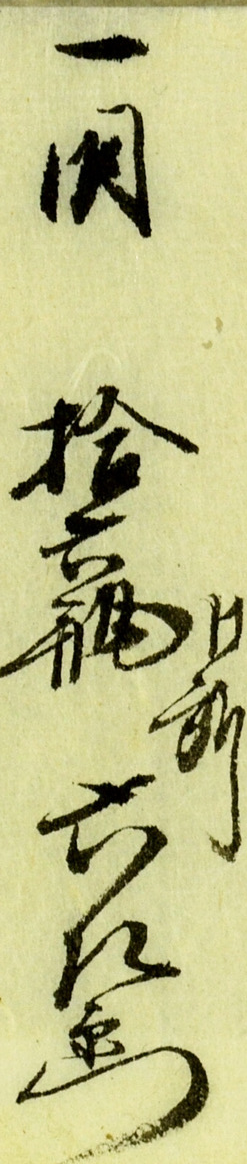一同拾六瓶六左衛門
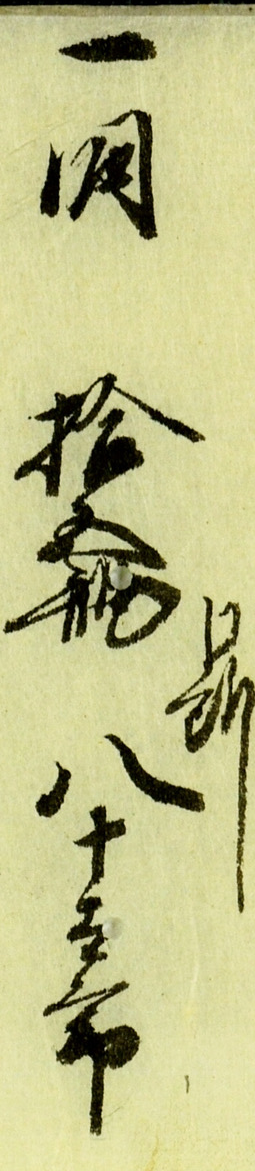一同拾五瓶八十太郎
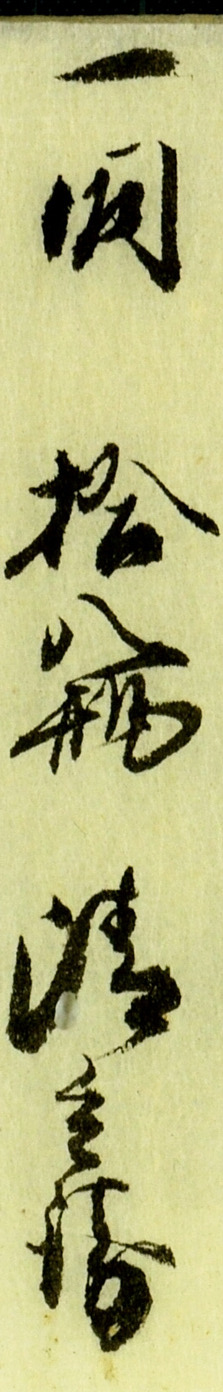一同拾八瓶清兵衛
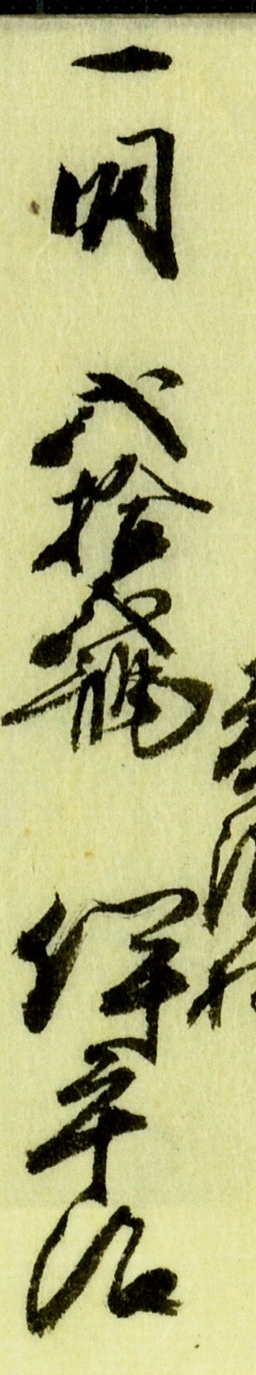一同弐拾弐瓶伊平治
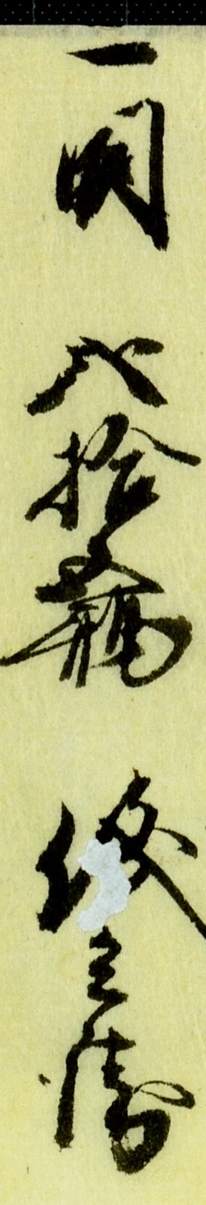一同弐拾五瓶儀兵衛

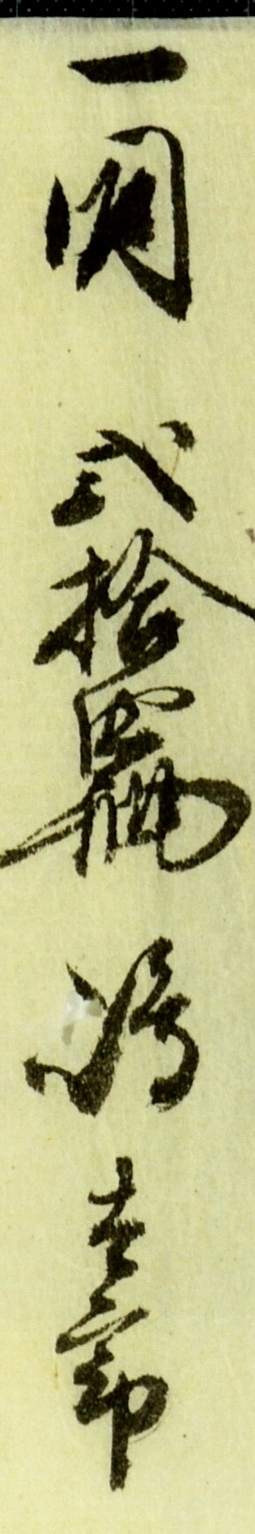一同弐拾弐瓶太八
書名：御領分中御領分中紺屋藍瓶員数御改帳
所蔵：伊那市立高遠町図書館・合同会社AMANE
